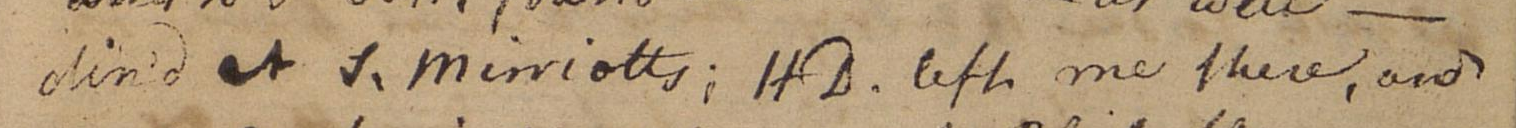din'd at S. Merriotts; HD. left me there, and
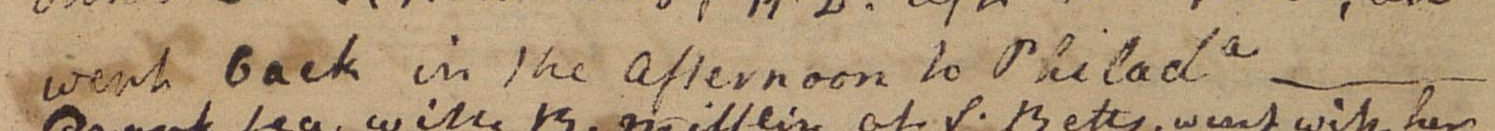went back in the afternoon to Philad^a -
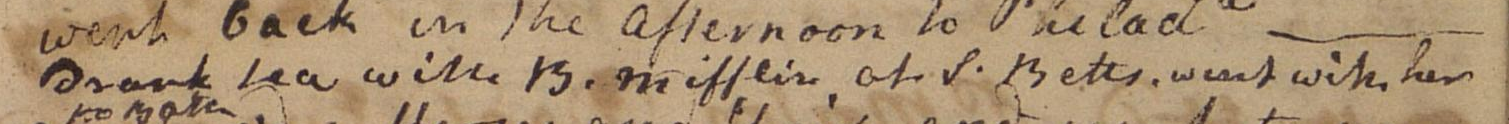drank tea with B. Mifflin, at S. Betts, went wih her
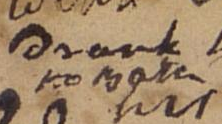to Bath
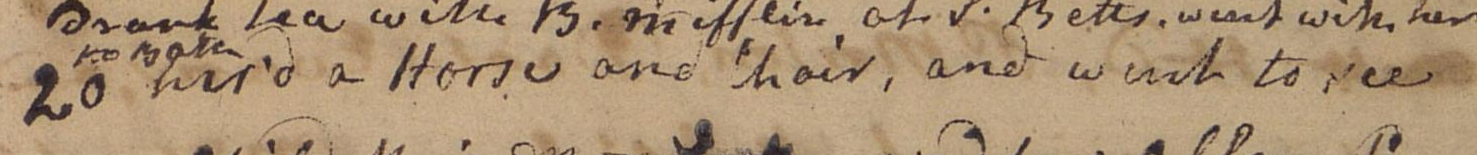20 hir'd a Horse and Chair, and went to see
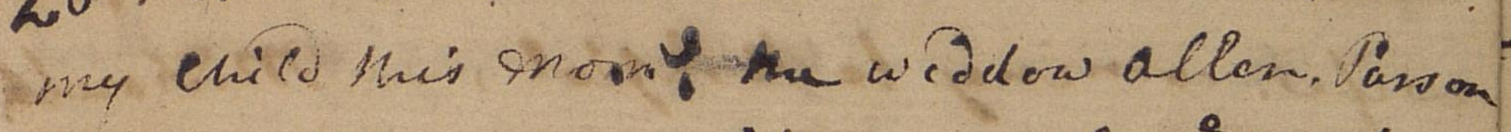my child this Morn^g. the widdow Allen, Parson
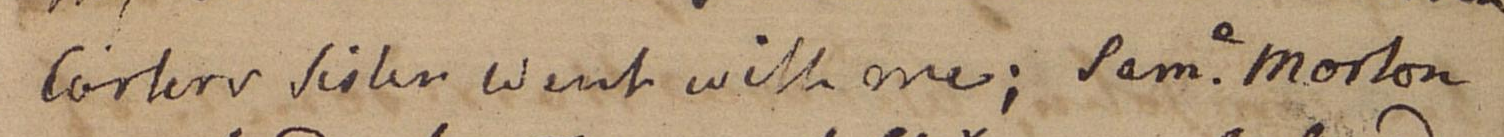Carters Sister went with me; Sam^l. Morton
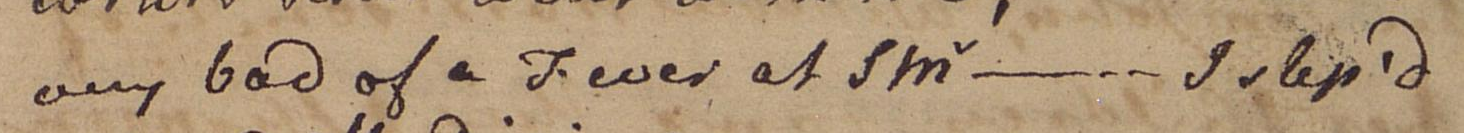very bad of a Fever at Sm^s-- I slep'd
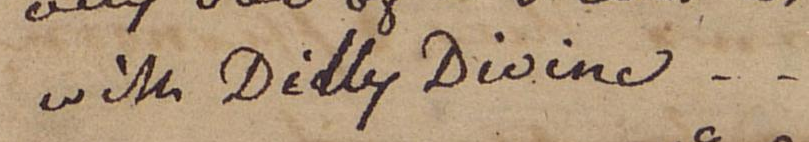with Dilly Divine--
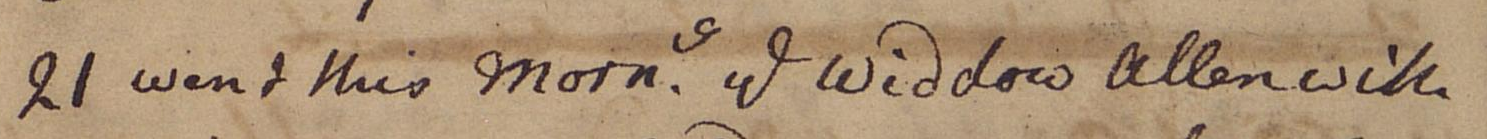21 went this morn^g. y^e Widdow Allen with
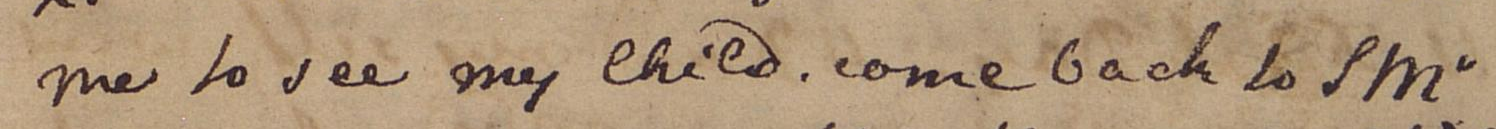me to see my child come back to SM^s
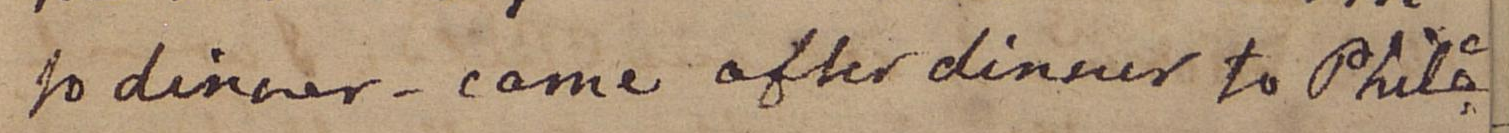to dinner-came after dinner to Phila^a
